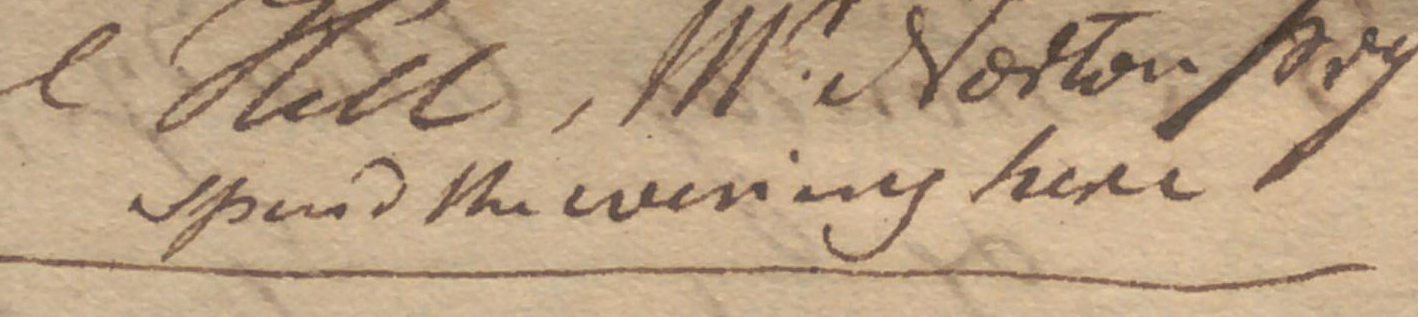spend the evening here &
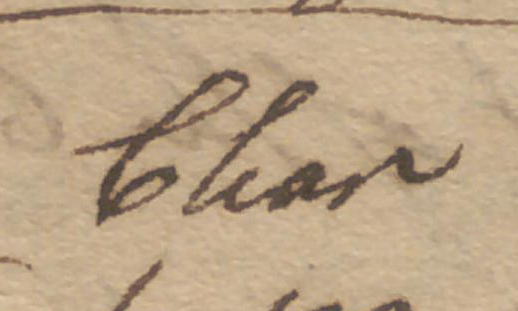Clear
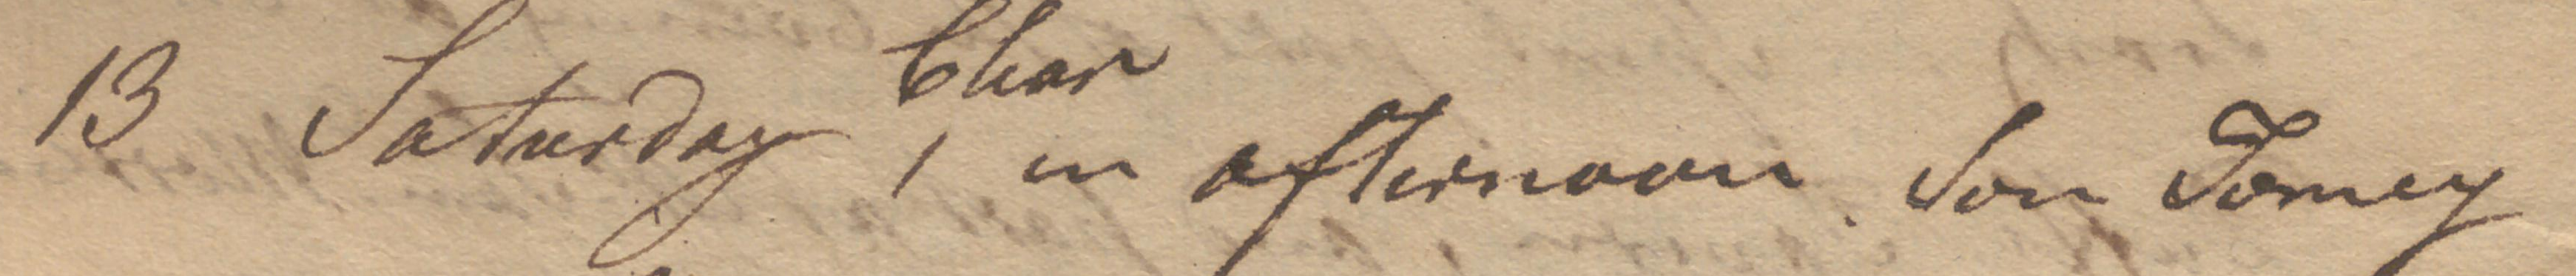13 Saturday ^ in afternoon. Son Tomey
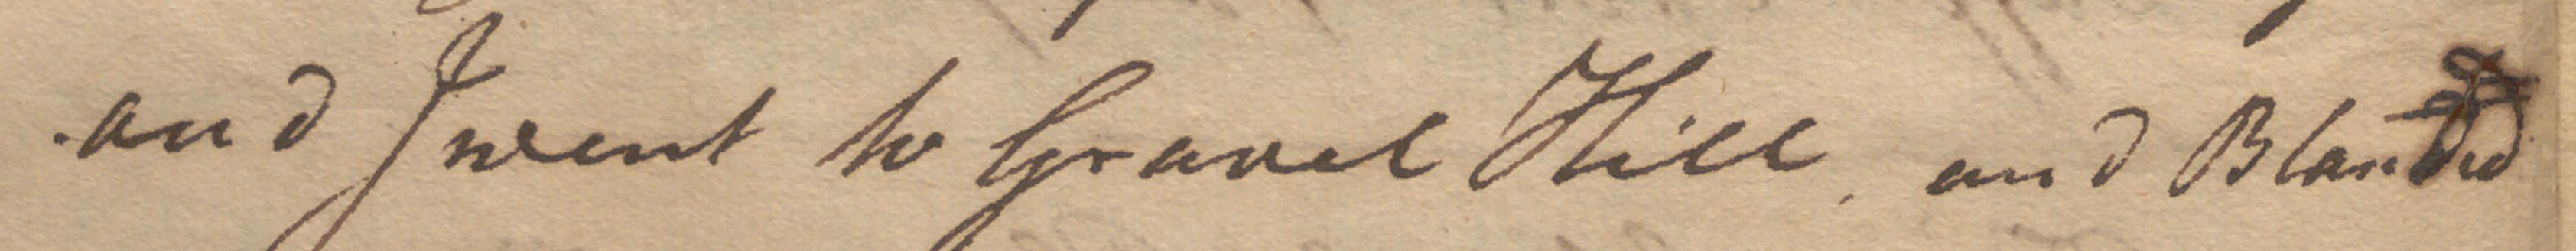and I went to Gravel Hill, and Blanded
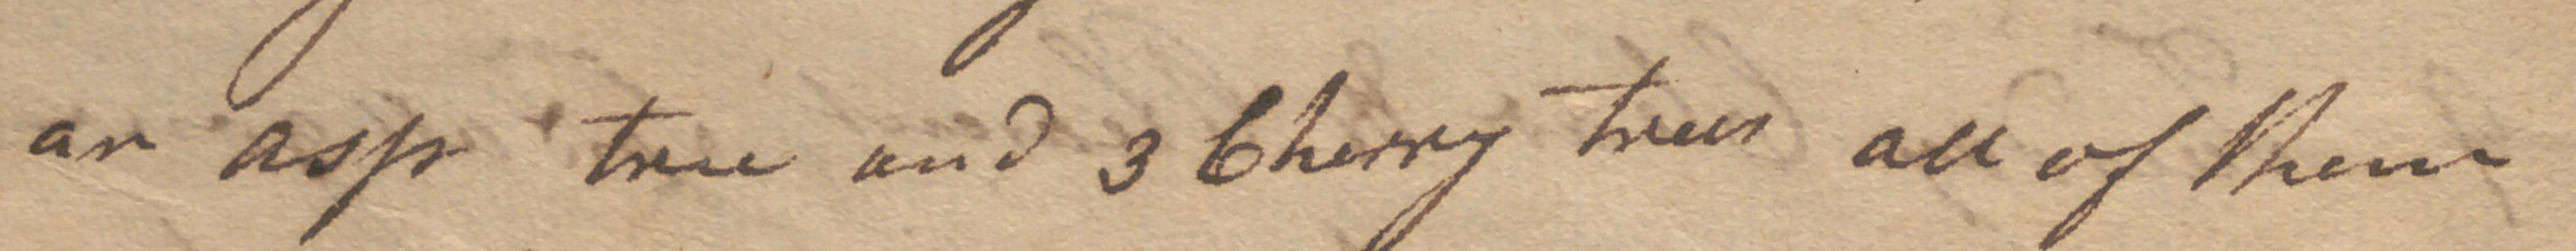an asp tree and 3 Cherny trees all of them
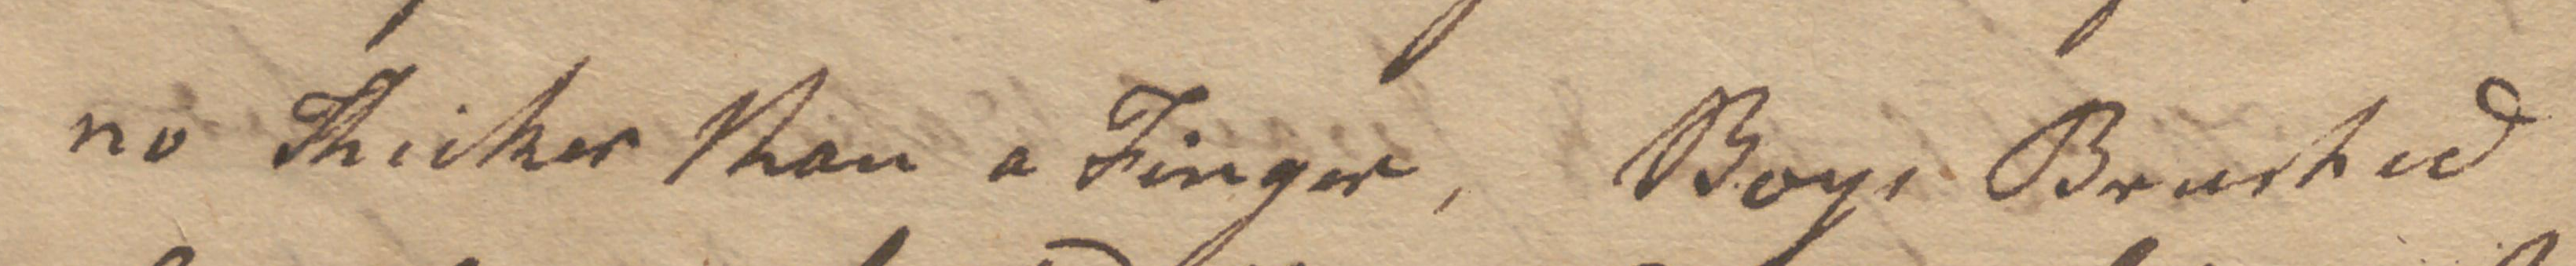no Thicker than a Finger, Boys Brushed
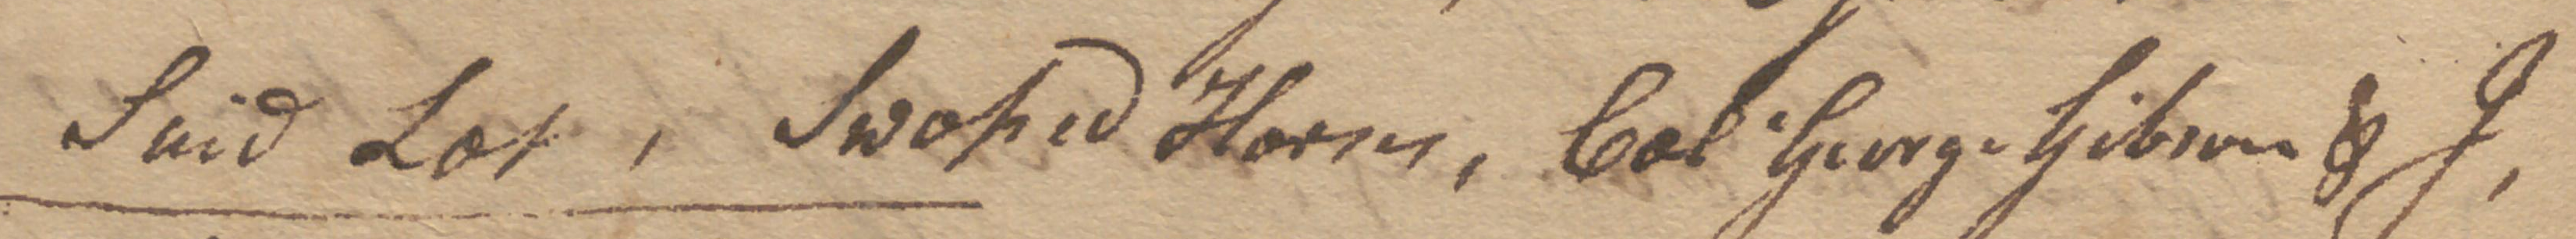said Lot. Swoped Horses, Col George Gibson & J
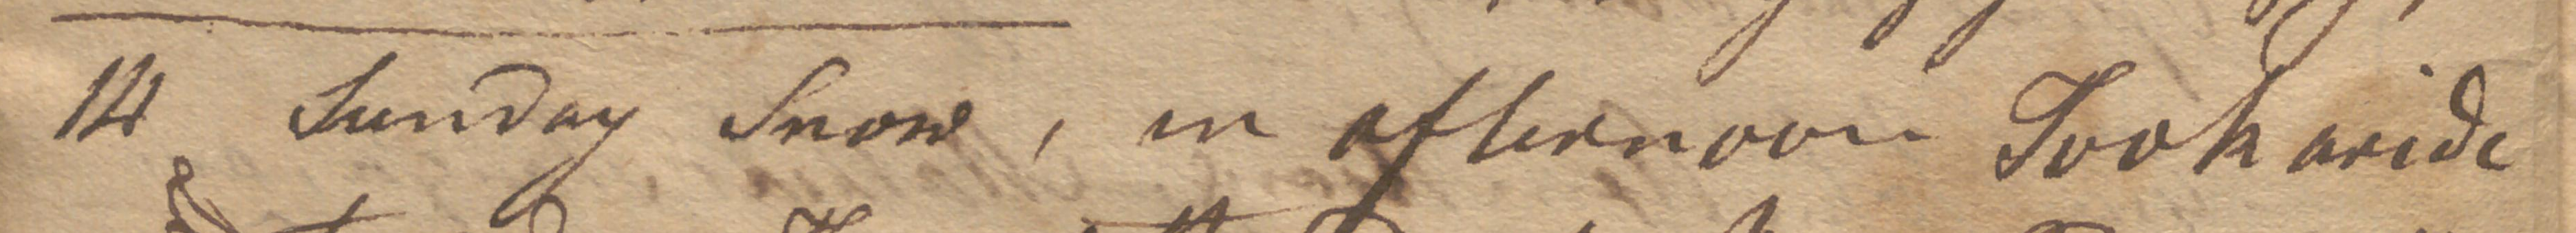14 Sunday Snow, in afternoon Took a ride
